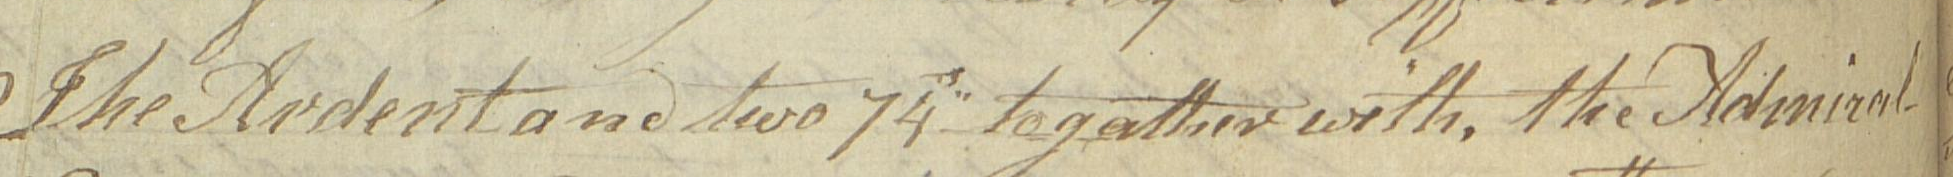The Ardent and two 74 together with, the Admiral
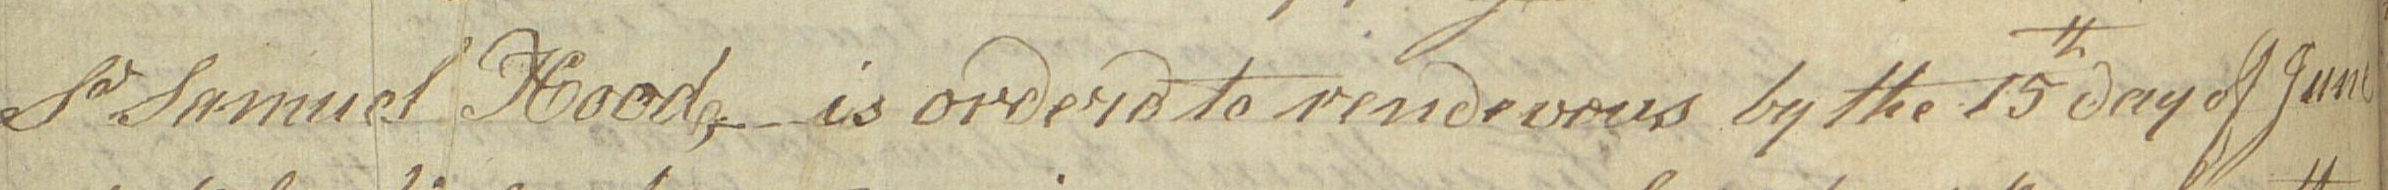S^r Samuel Hood is orderd to rendevous by the 15^th day of June
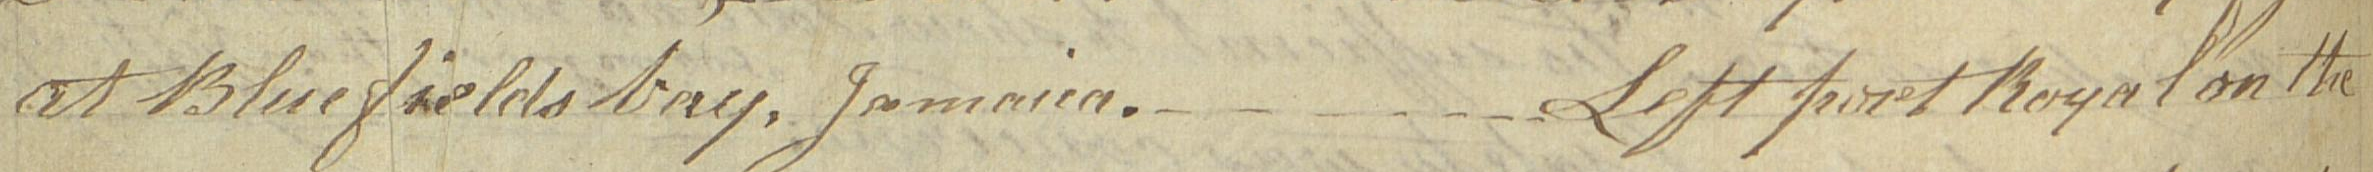at Blue fields bay, Jamaica. Left port Royal on the
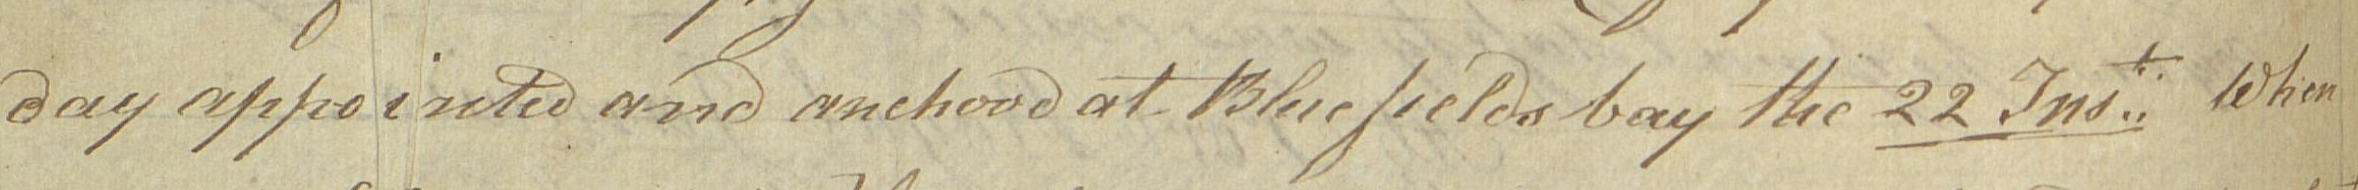day appointed and anchord at Blue fields bay tho 22 Ins^t. When
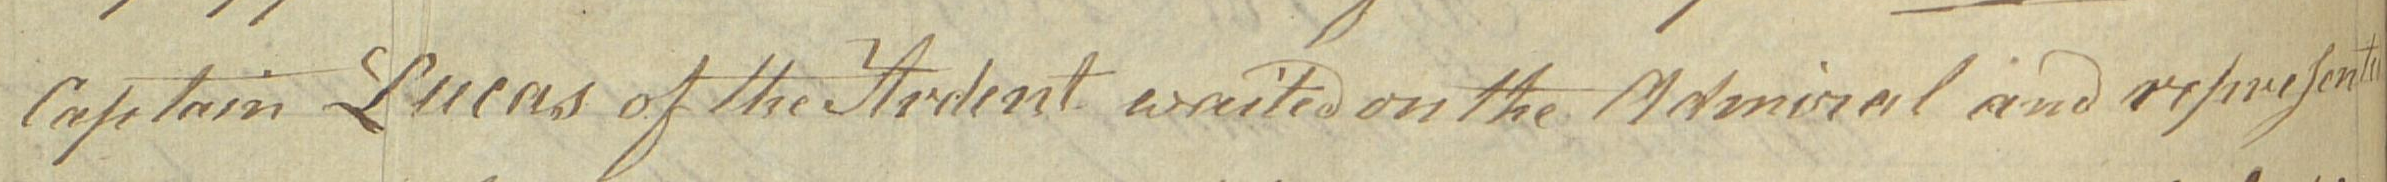Captain Lucas of the Ardent waited on the Admiral and represent-
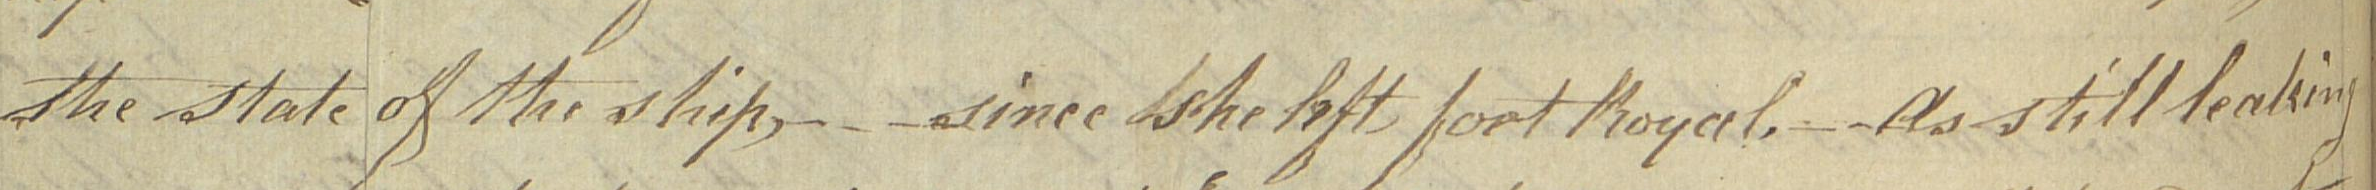the state of the ship, since she left port Royal, as still leaking
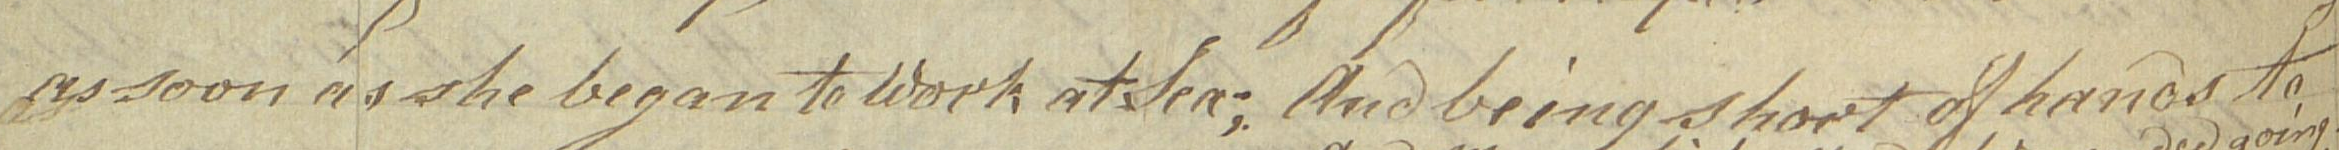as soon as she began to work at Sea; and being short of hands to
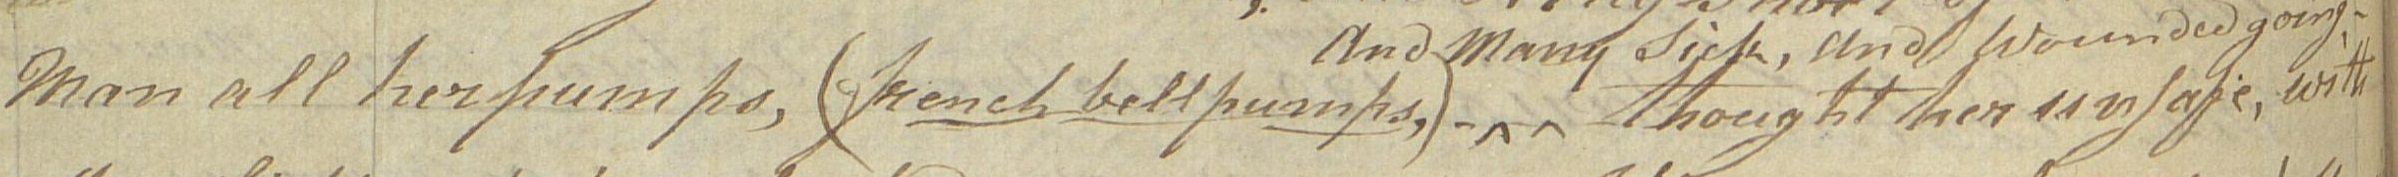Man all her pumps, (french bell pumps,) ^ Thought her unsafe, with
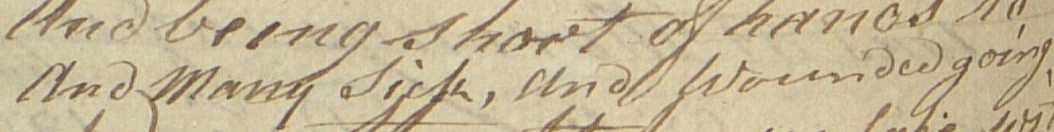And Many Sick, And wounded going
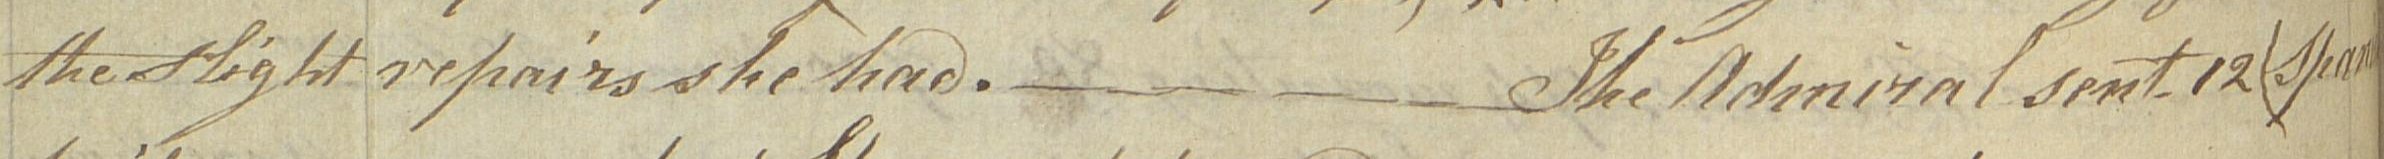the Slight repairs she had. The Admiral sent 12 (Spa-
